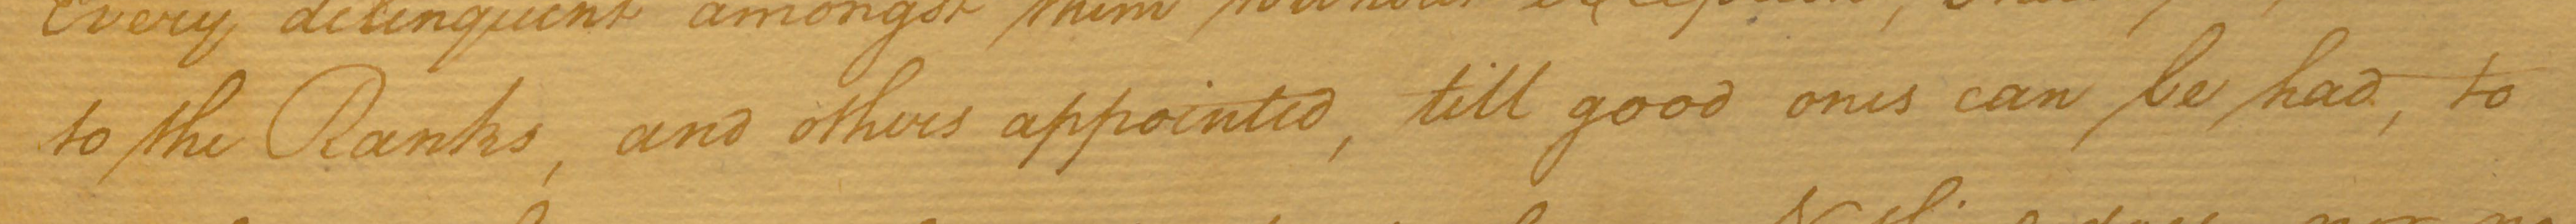to the Ranks, and others appointed, till good ones can be had, to
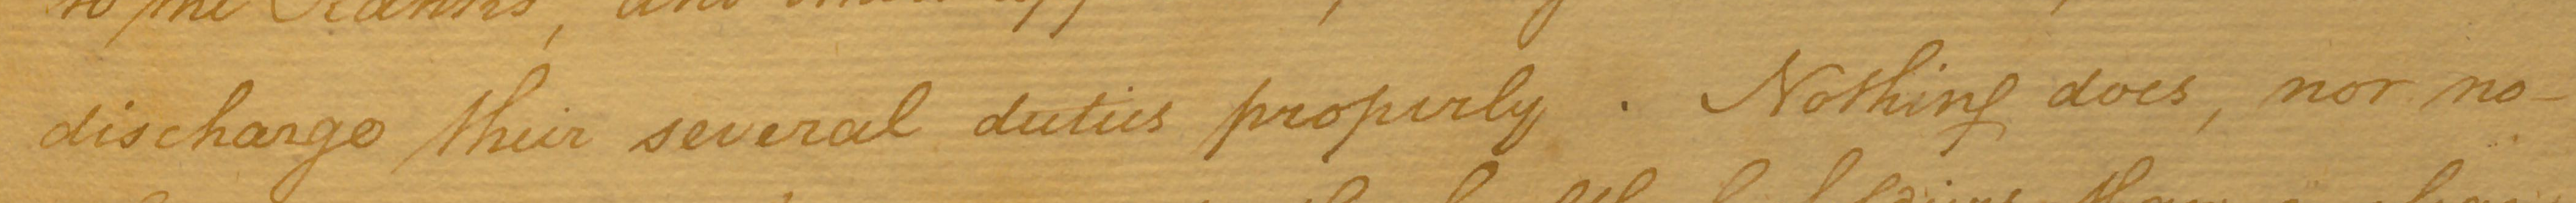discharge their several duties properly. Nothing does, nor no-
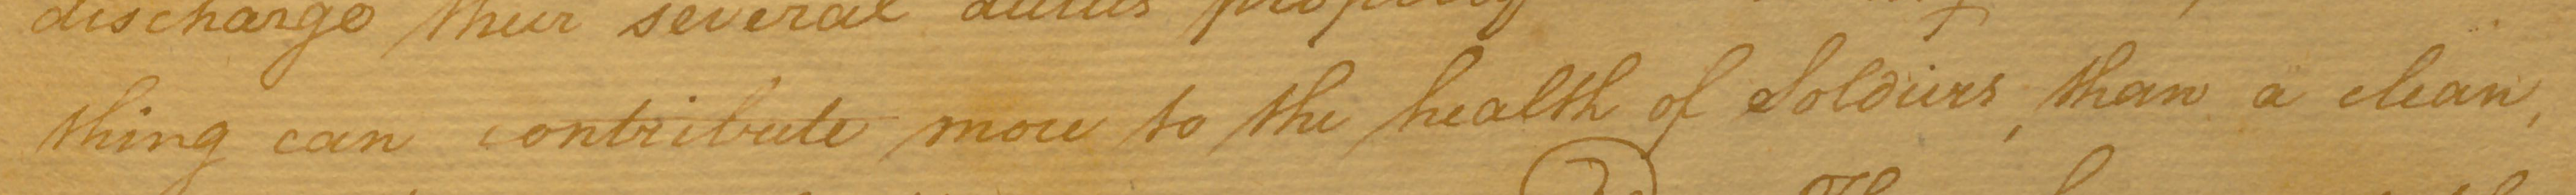thing can contribute more to the health of Soldiers, than a clean
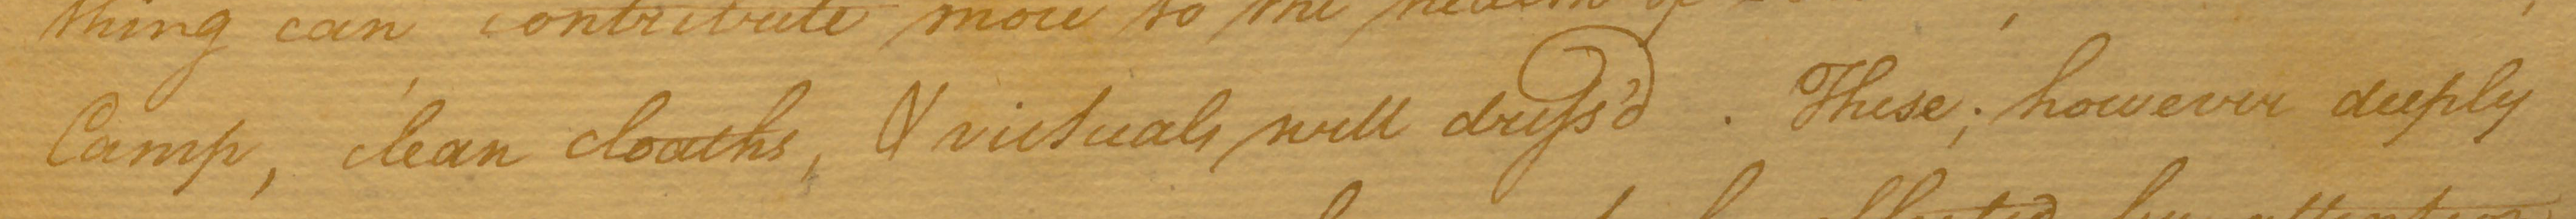Camp, clean cloaths, & victuals well dress'd. These, however deeply
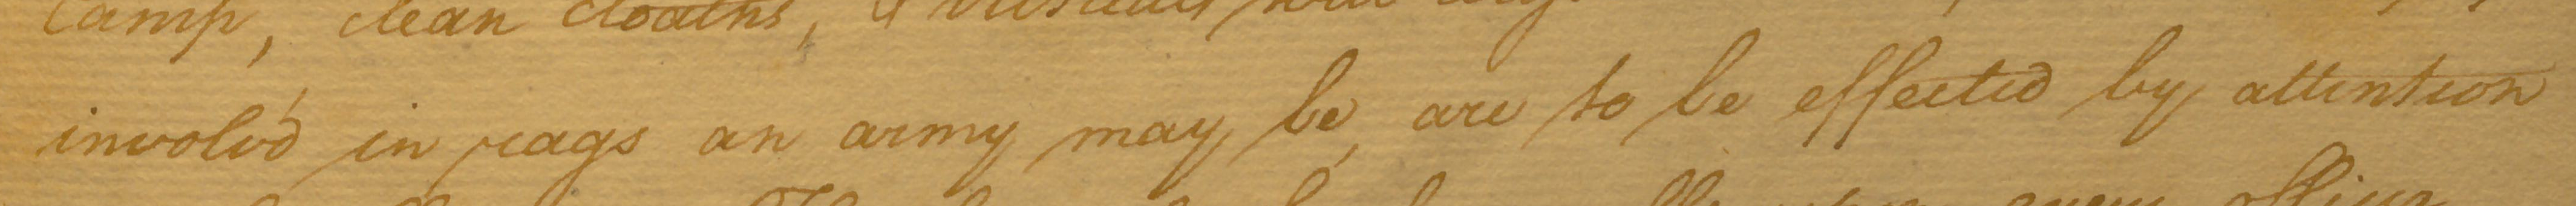involv'd in rags an army may be are to be effected by attention
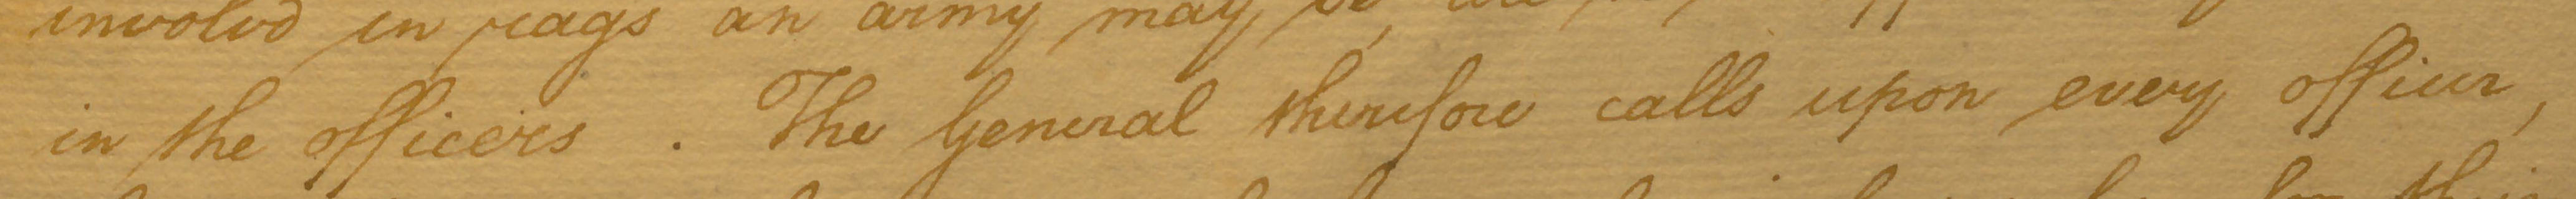in the officers. The General therefore calls upon every officer
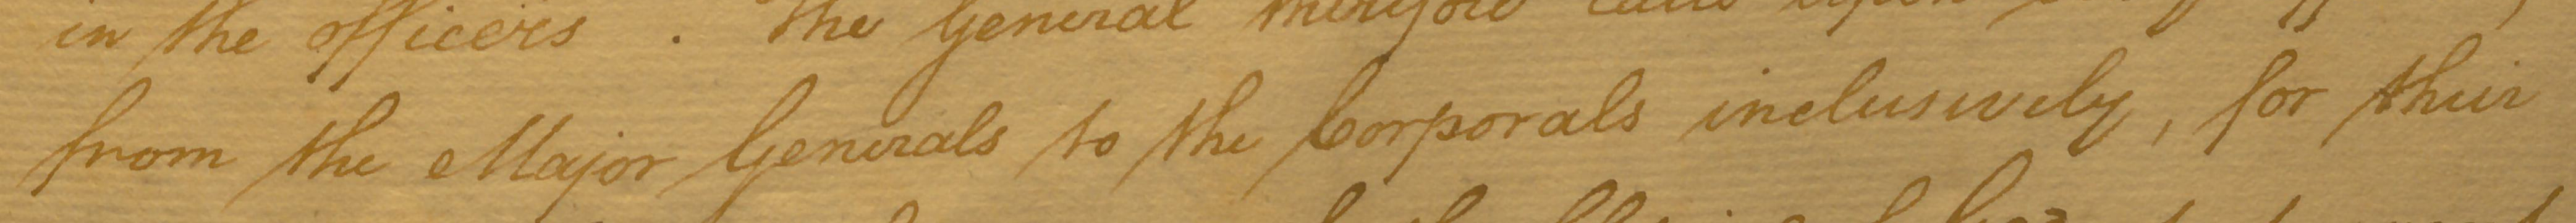from the Major Generals to the Corporals inclusively, for their
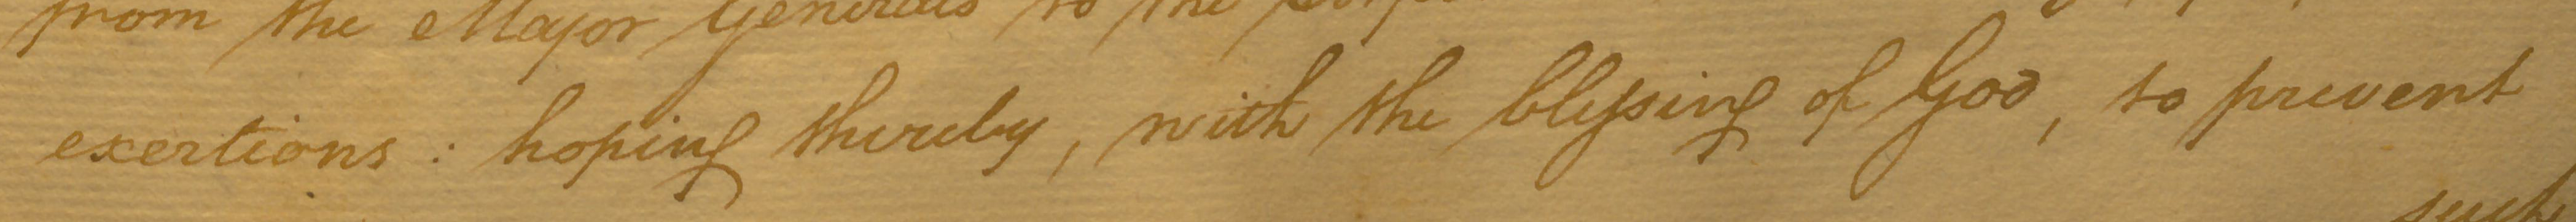exertions: hoping thereby, with the blessing of God, to prevent
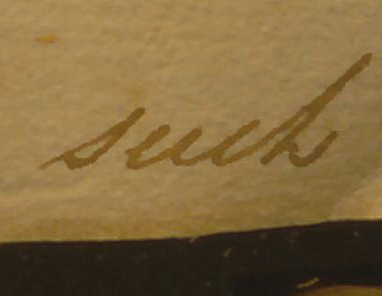such
